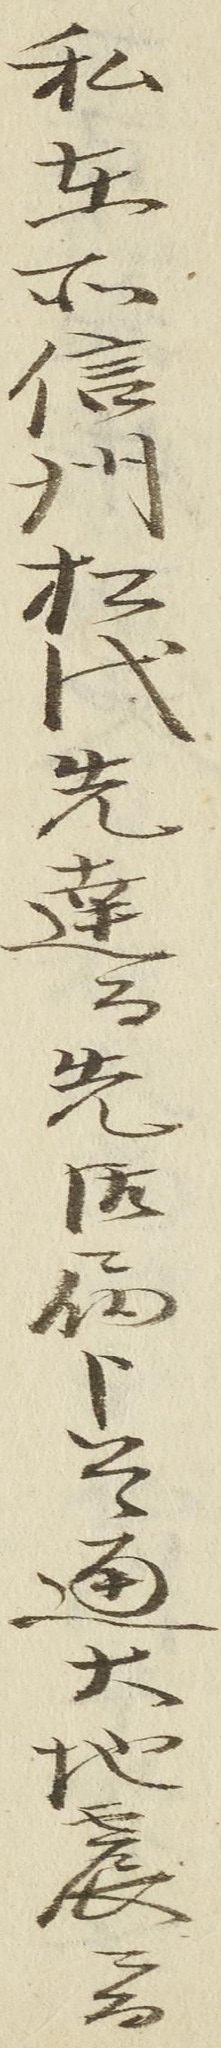私在所信州松代先達而先御届申上候通大地震
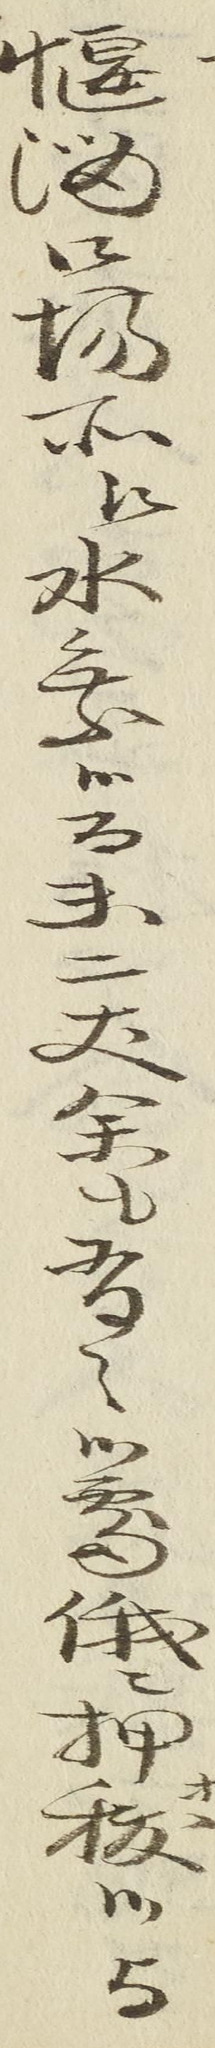堰留候場所江水乗候而未弐丈余も有之候処俄二押抜候と
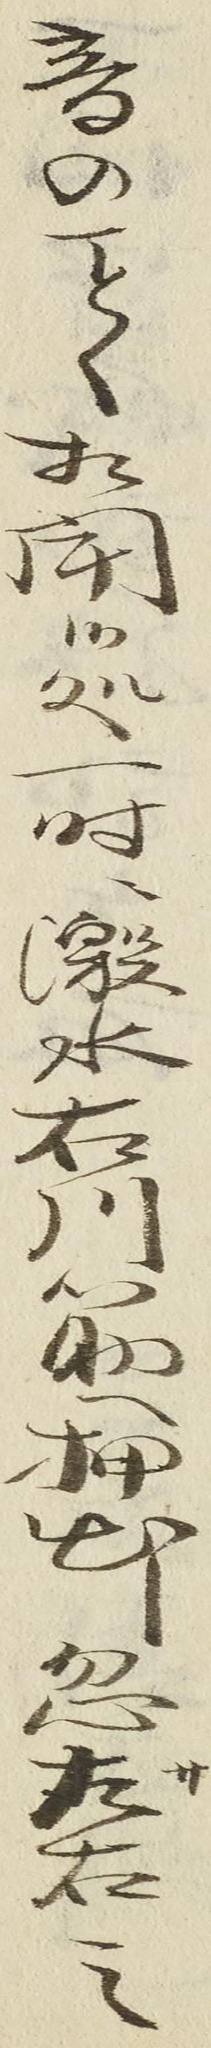音のことく相聞候処一時二激水右川筋へ押出し忽左右之
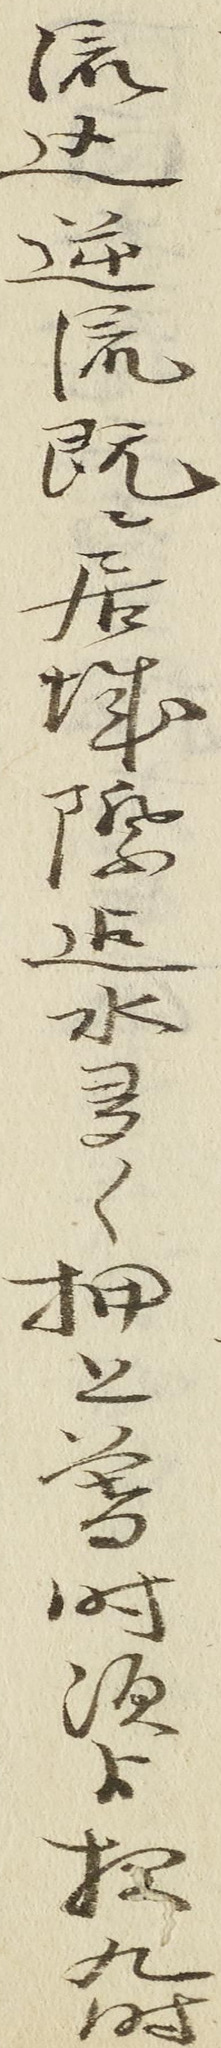流込逆流既二居城際迄水多押上暮時頃ゟ夜九時
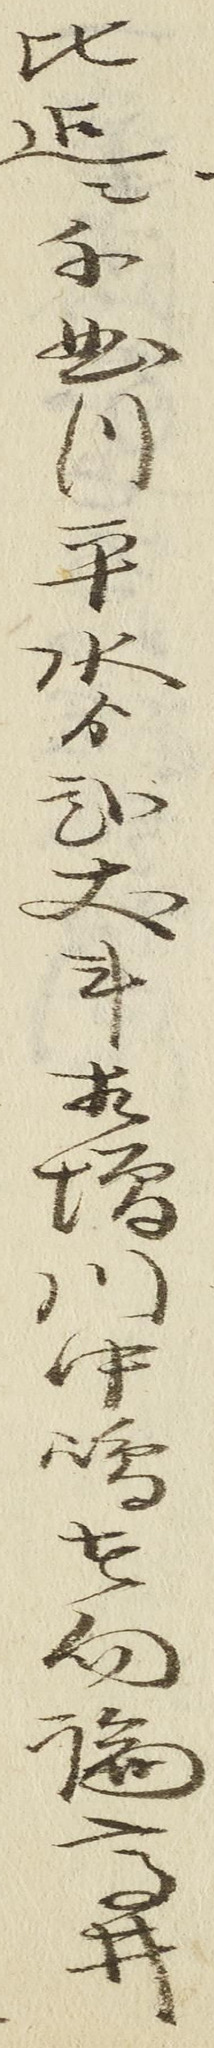比迄二千曲川平水ゟ弐丈斗相増川中嶋は勿論高井
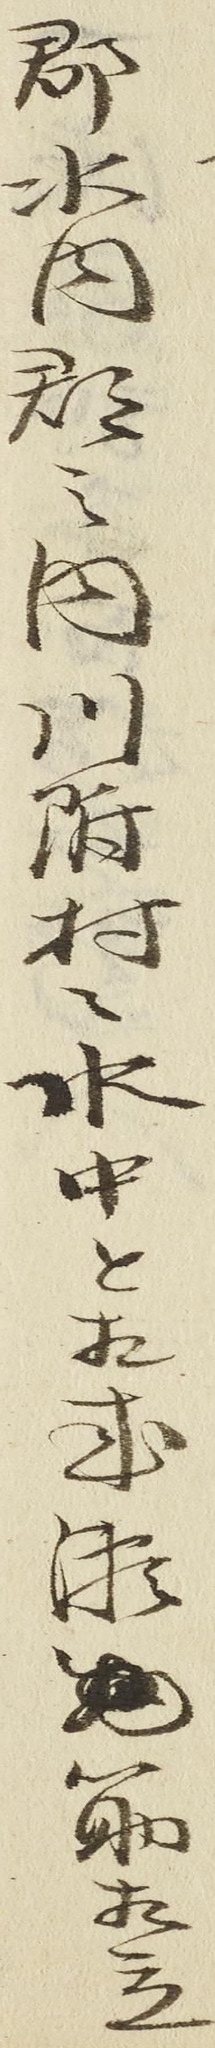郡水内郡之内川附村々水中と相成瀬筋相立
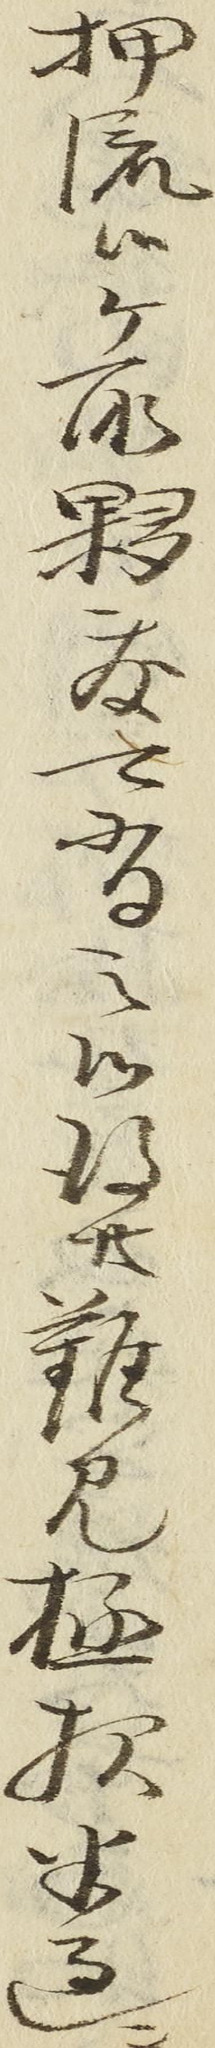押流候ヶ所夥敷可有之候得共難見極夜半過二
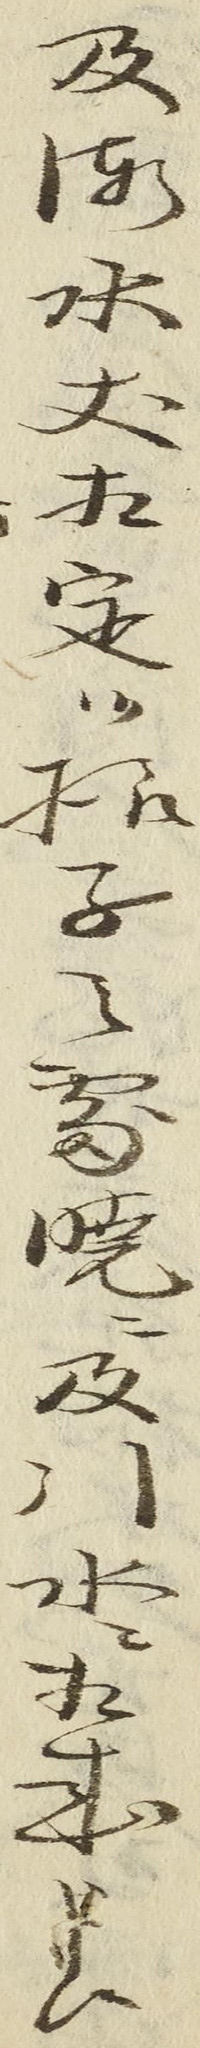及漸水丈相定候様子之処暁二及引水二相成申候
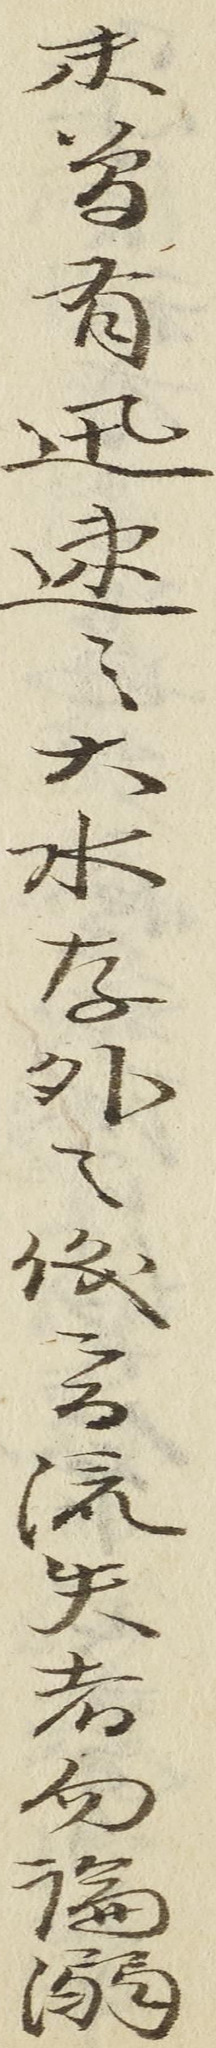未曾有迅速之大水存外之儀二而流失は勿論溺
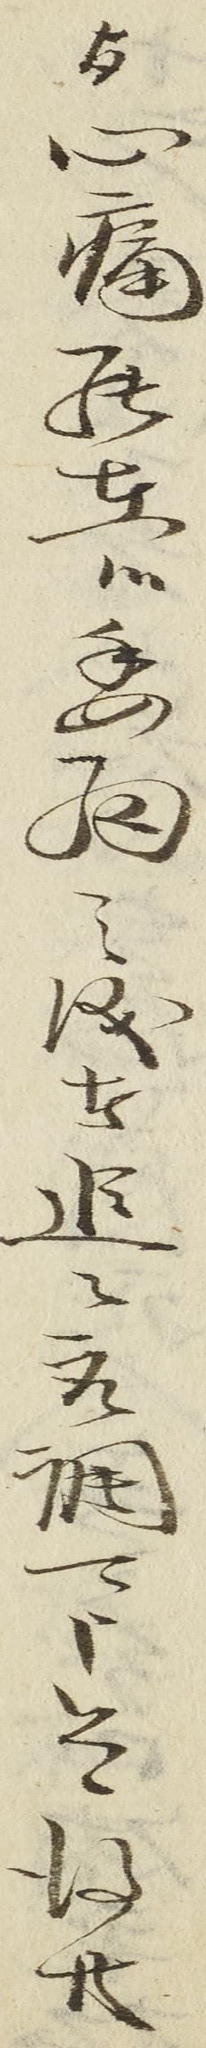と心痛罷在候委細之儀は追々取調可申上候得共
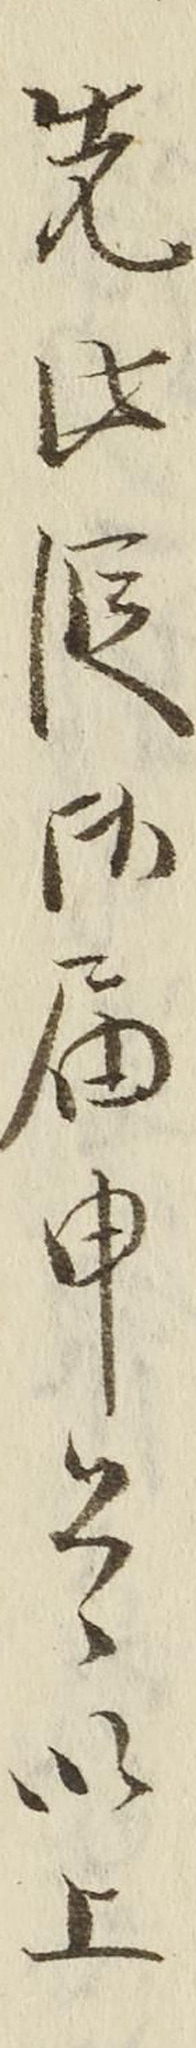先此段御届申上候以上

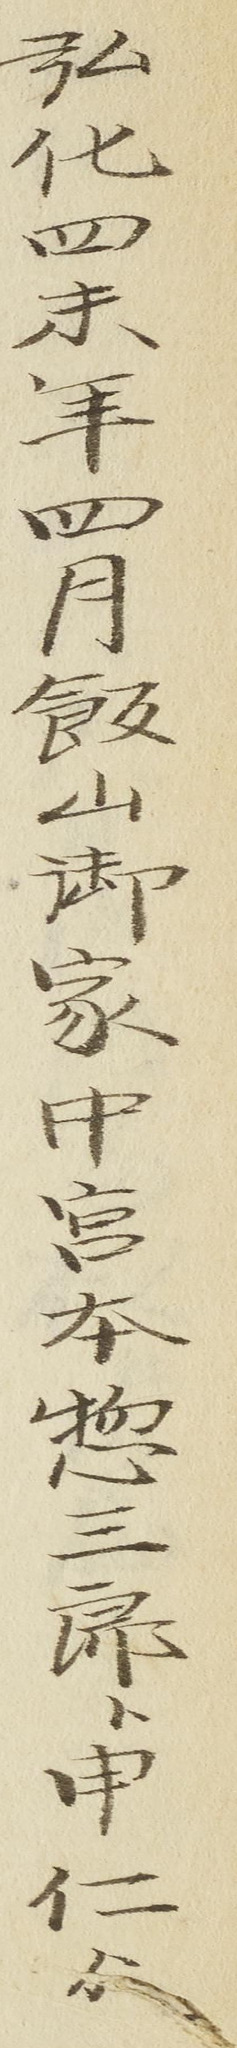弘化四未年飯山御家中宮本惣三郎ㇳ申仁ゟ
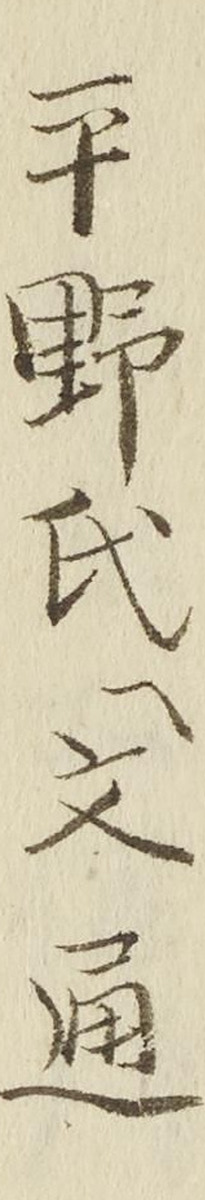平野氏へ文通
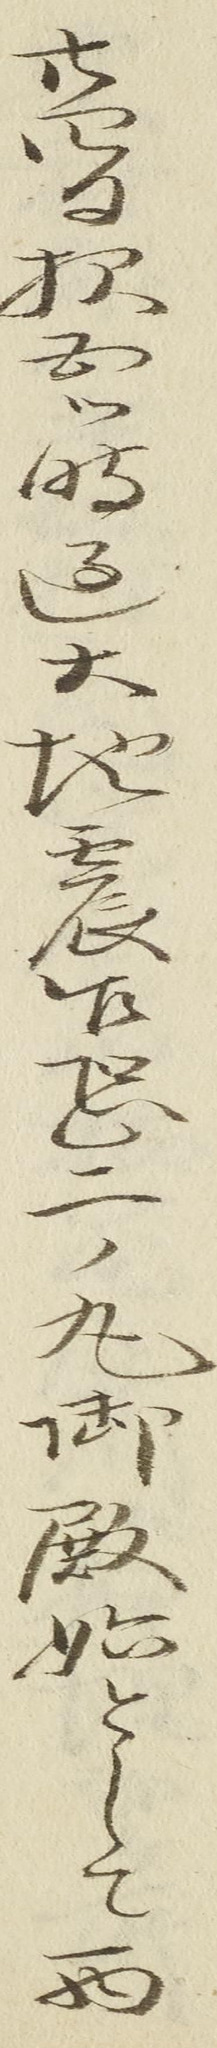廿四日夜五ッ時過大地震乍恐二ノ御丸御殿始として西
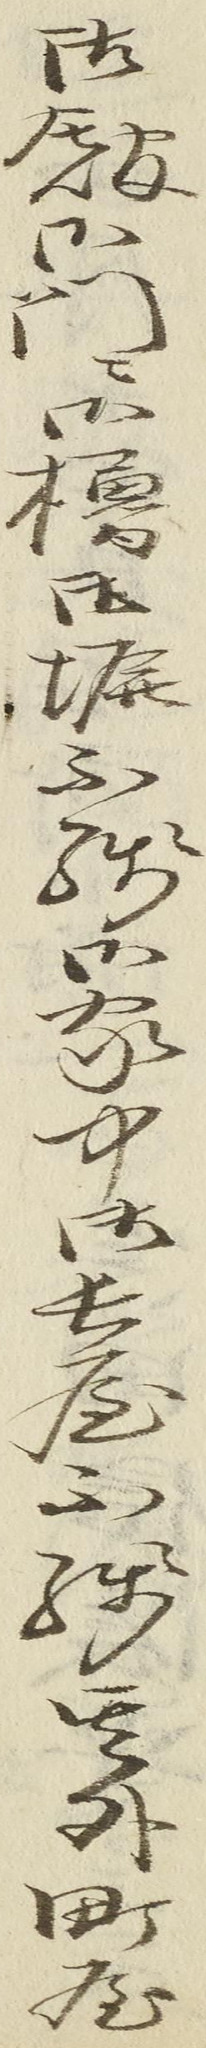御館御門之御櫓御塀不残御家中御長屋不残其外町家
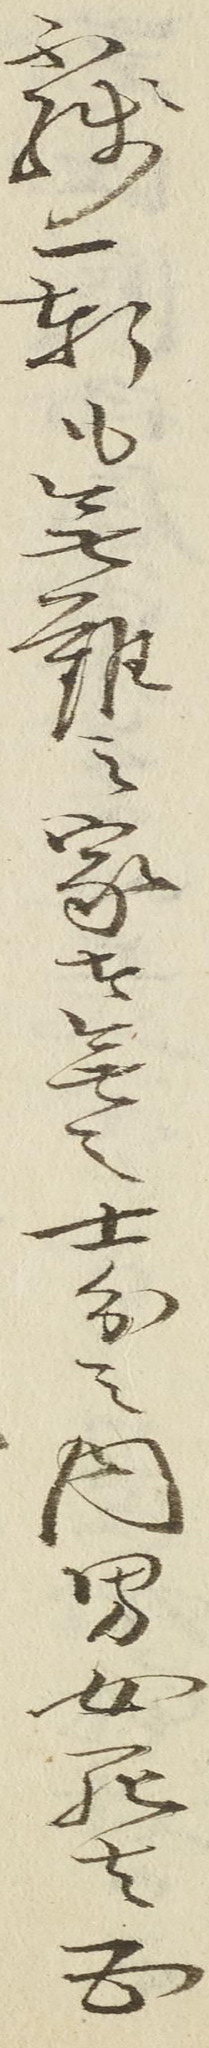不残一軒も無難之家は無之士分之内男女死は五
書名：信濃國大地震記　乾
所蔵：東京大学地震研究所図書室 Earthquake Research Institute Library, The University of Tokyo, JAPAN
